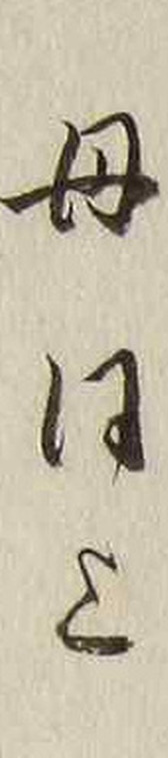母同上

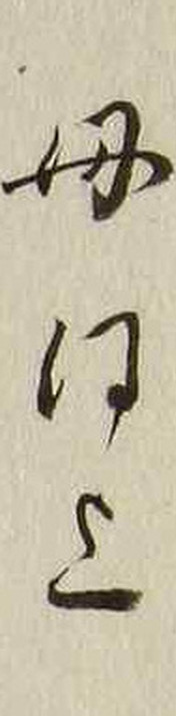母同上
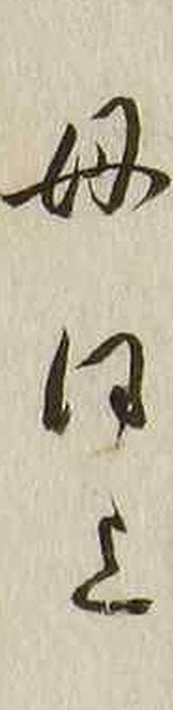母同上
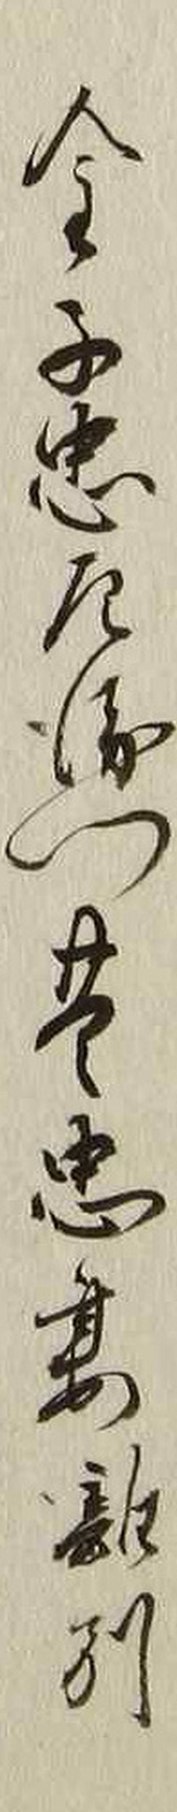女金子忠左衛門豊忠妻離別
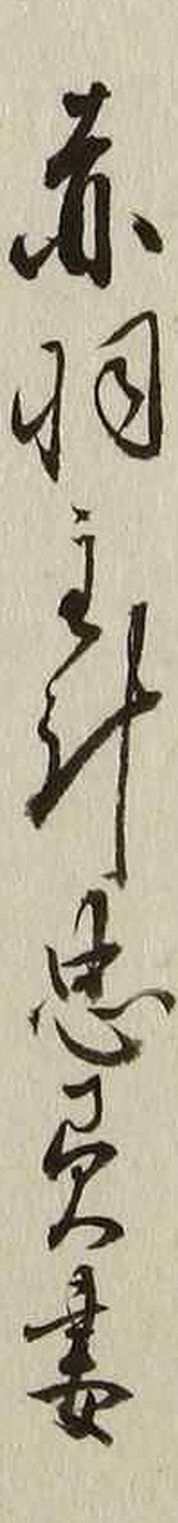赤羽主計忠美妻
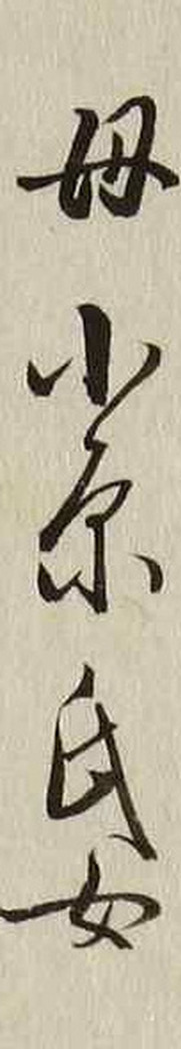母小原氏女
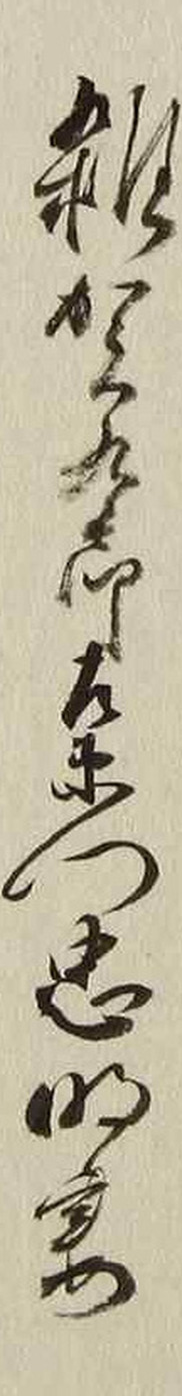女雑賀九郎左衛門忠明妻
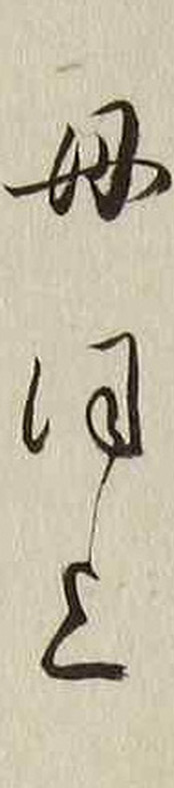母同上
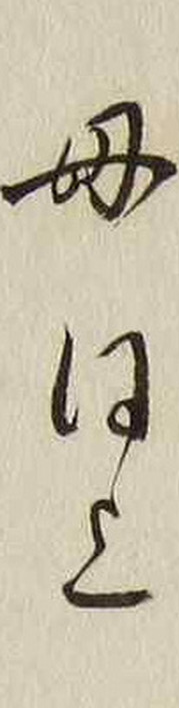母同上
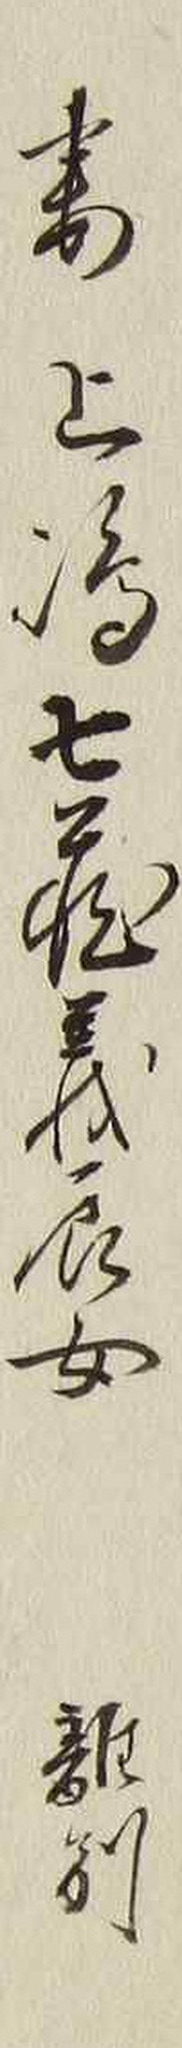妻上嶋七蔵義辰女離別
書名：諸士系譜　巻之141　た之部17
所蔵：会津若松市立会津図書館
